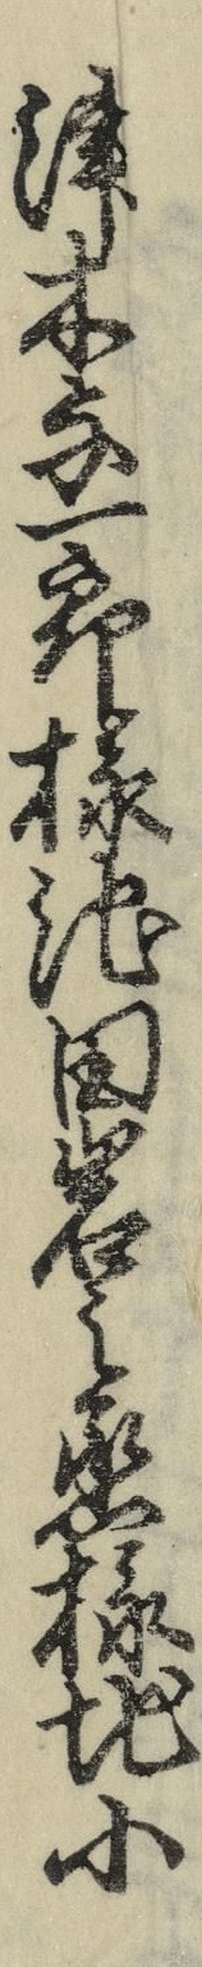津木与一郎様池田岩之烝様小
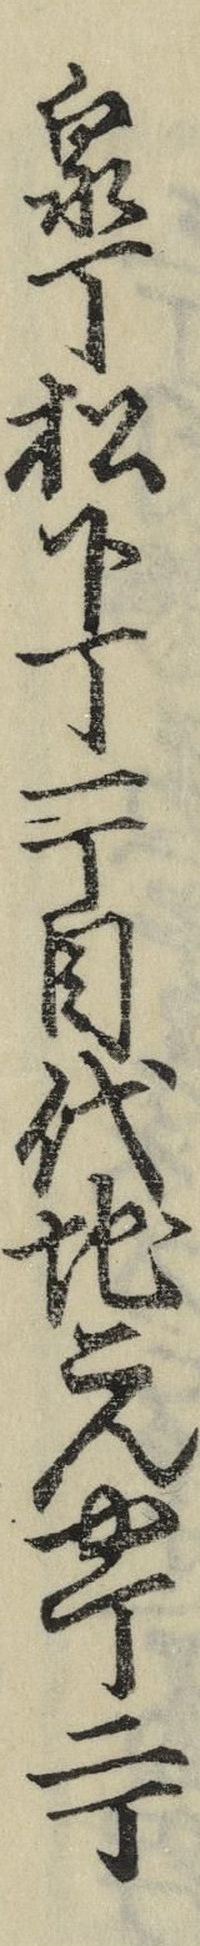泉丁松下丁一丁目代地こんや丁二丁
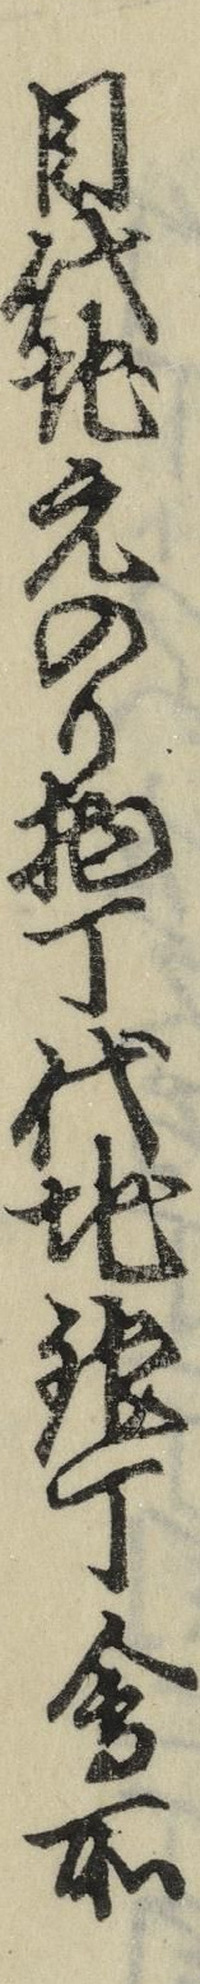目代地元のり物丁代地銀丁会所
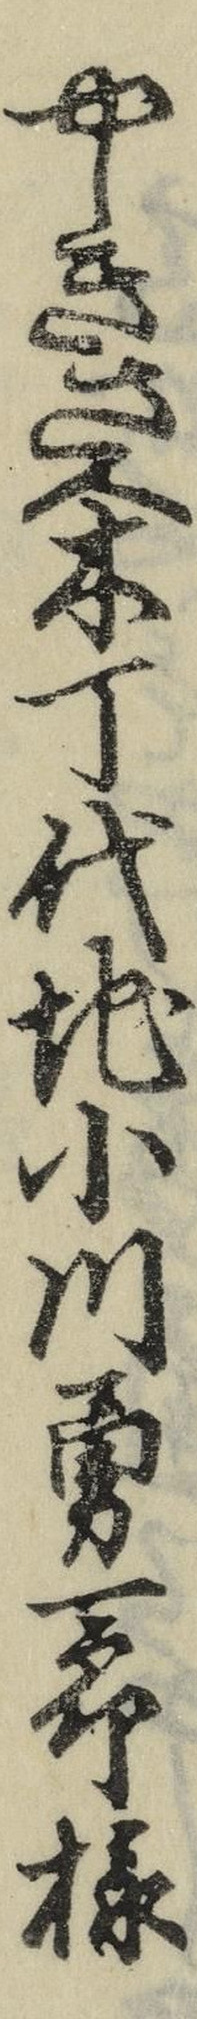やきさへ木丁代地小川勇一郎様
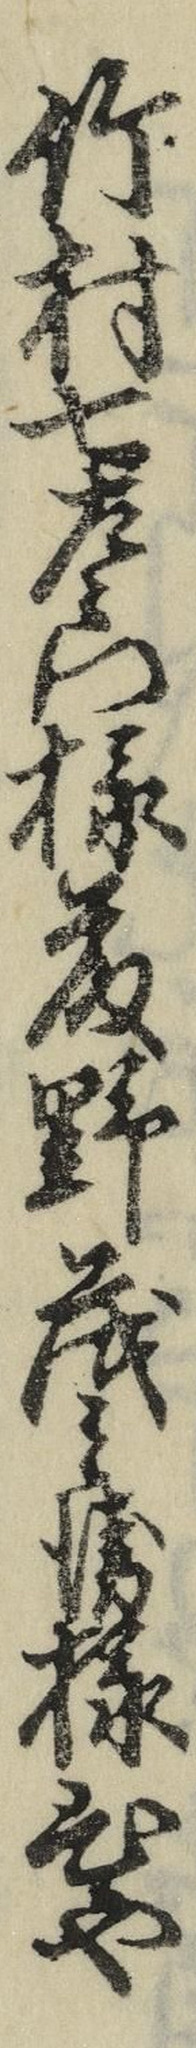竹村七左衛門様藤野茂兵衛様ひや
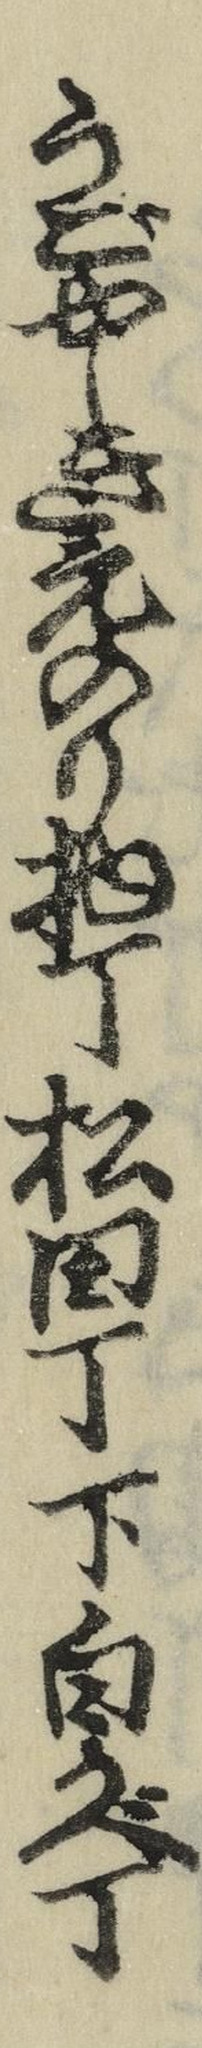うごやしき元のり物丁松田丁下白かべ丁
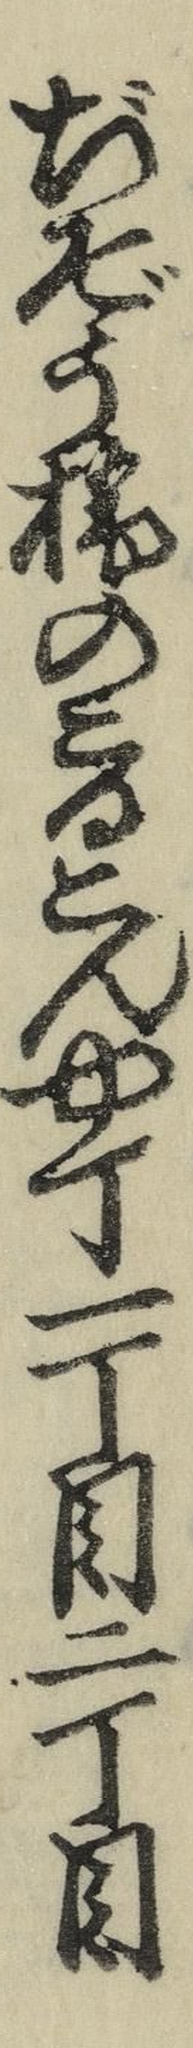ぢぞう橋のこるこんや丁一丁目二丁目
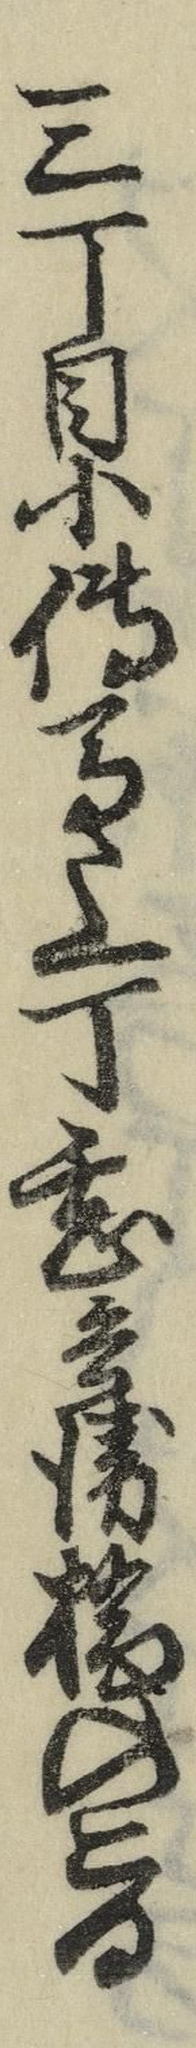三丁目小伝馬上丁甚兵衛橋のこる

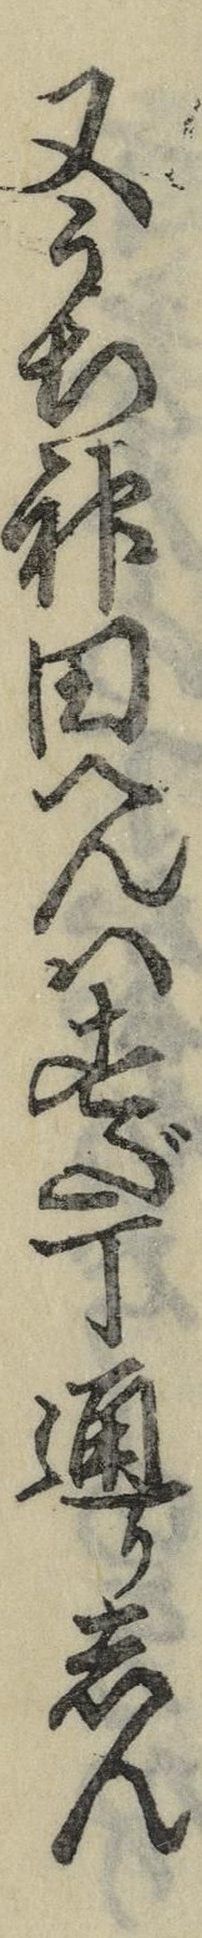又うち神田へんはすだ丁通りしん
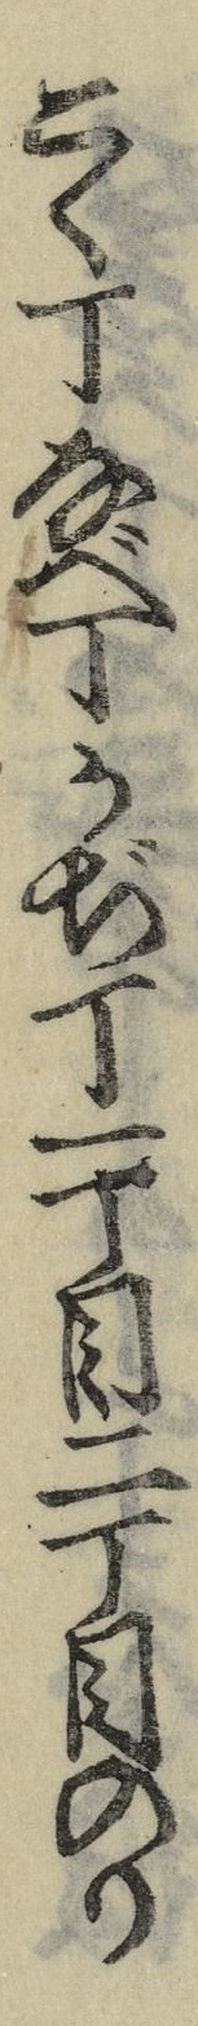こく丁なべ丁うぢ丁一丁目二丁目のり
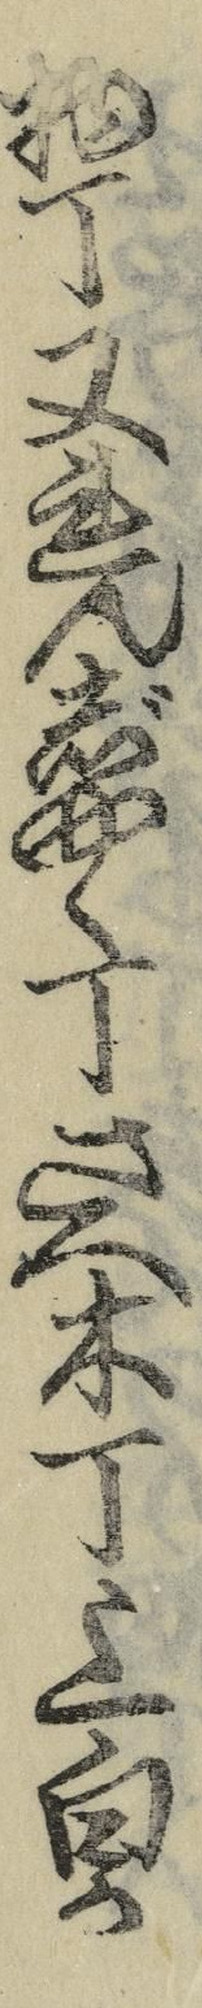物丁又れんじやく丁さへ木丁上白う
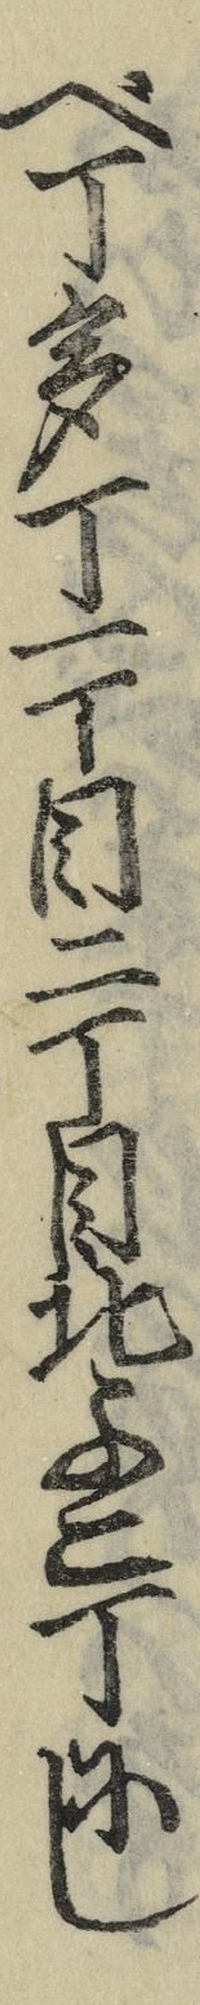べ丁多丁一丁目二丁目北よこ丁にし
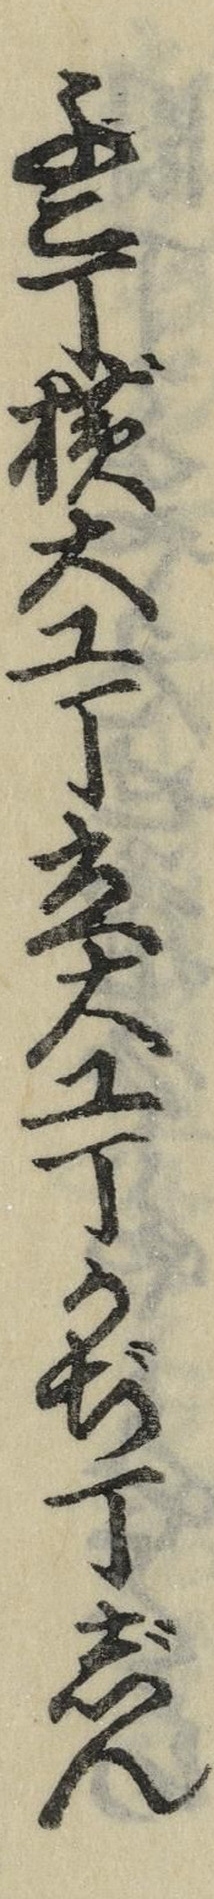よこ丁横大工丁立大工丁うぢ丁じん
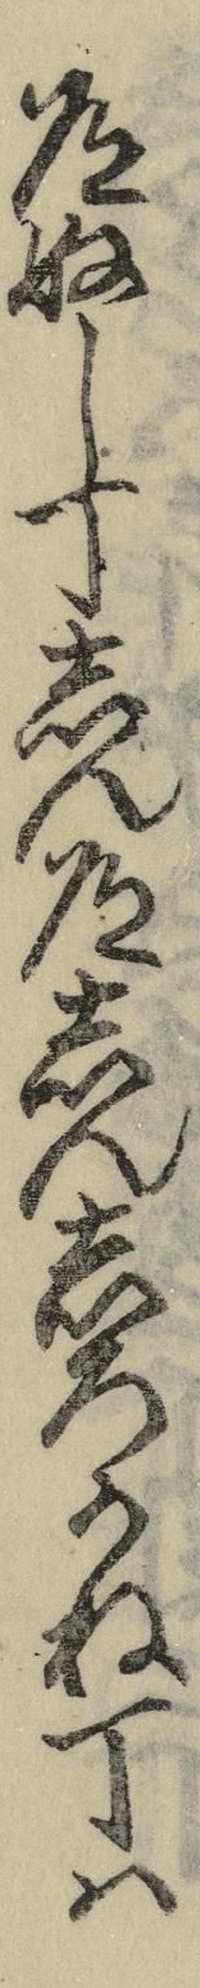道ぬし丁しん道しんしろうね丁は
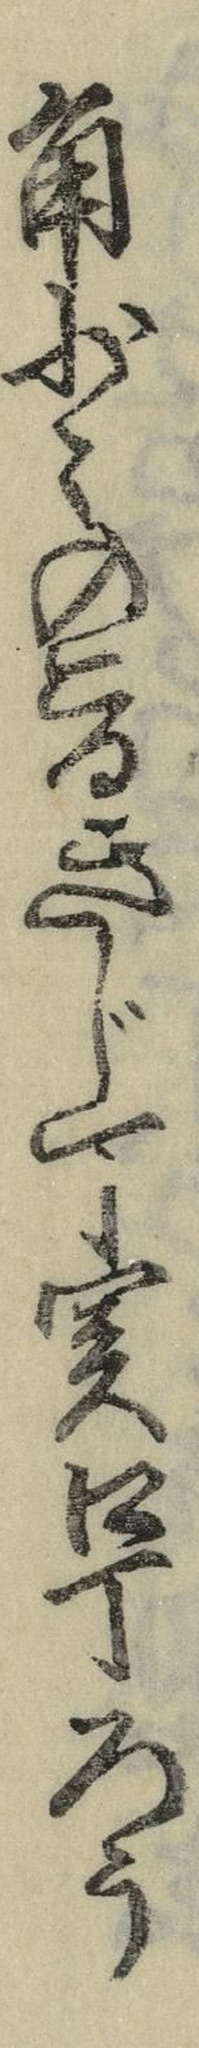角少々のこるきじ丁実口丁ろう
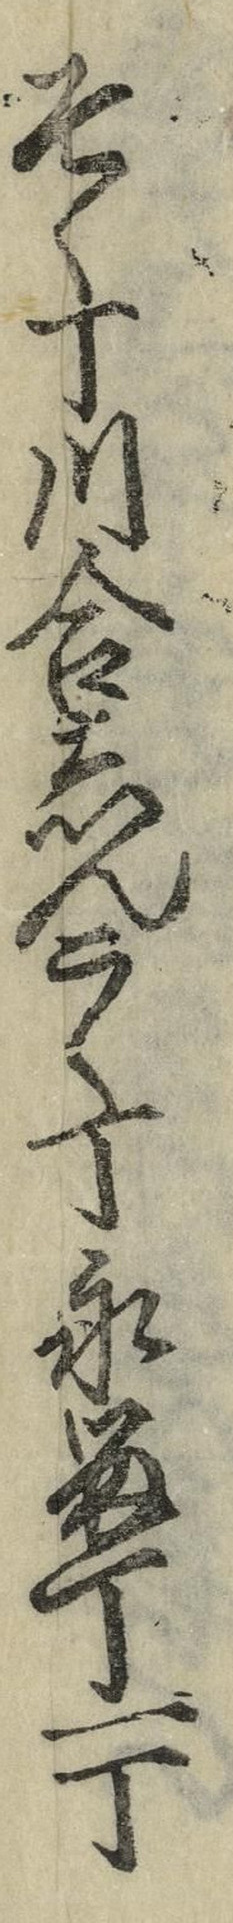そく丁川合しんこく丁永留丁一丁
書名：大江戸焼場所明細之写　附出火方角画圖　戊午安政五年十一月十五日
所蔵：東京大学地震研究所図書室 Earthquake Research Institute Library, The University of Tokyo, JAPAN
